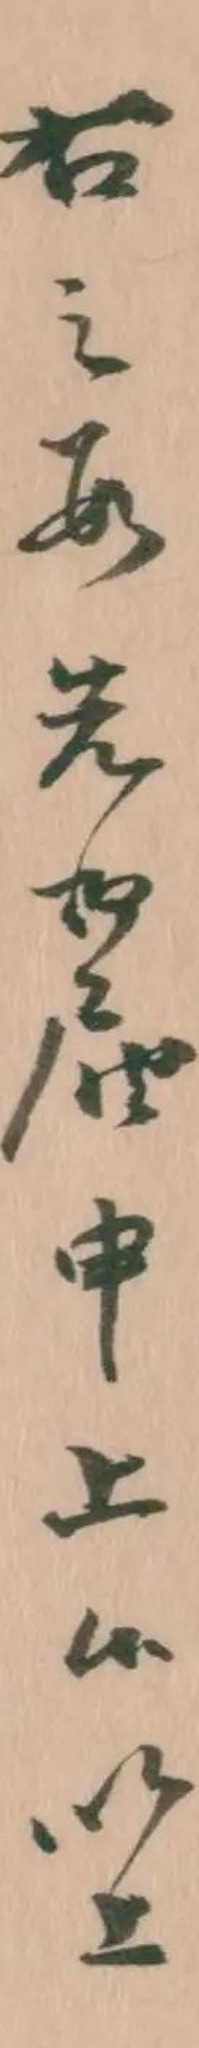右之段先御届申上候以上
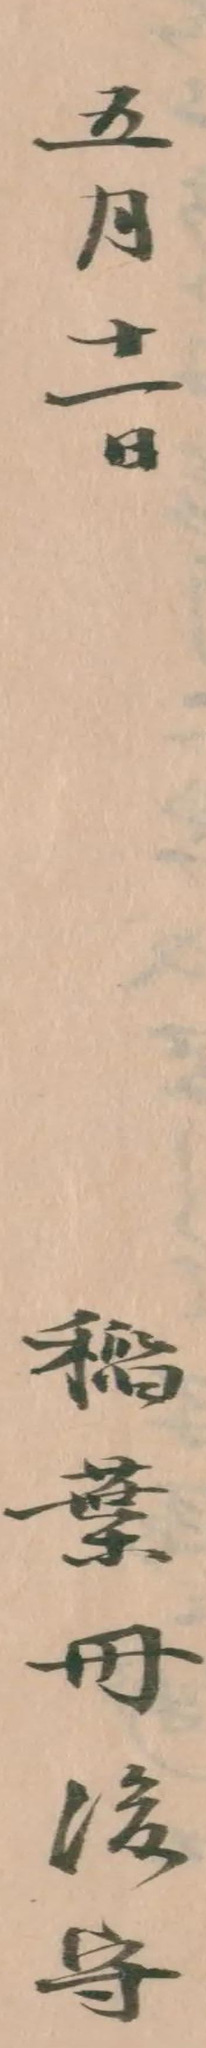五月十一日稲葉丹後守

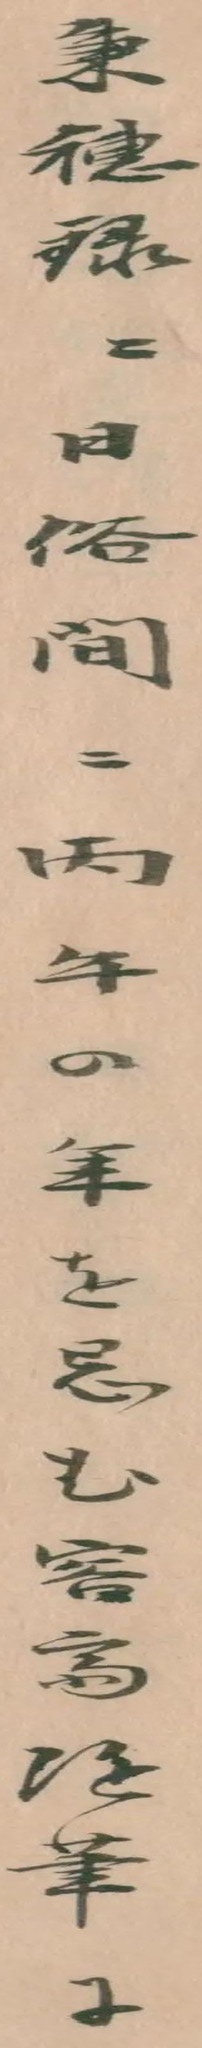兼穂録二曰俗間に丙午の年を忌ムハ容斎随筆に
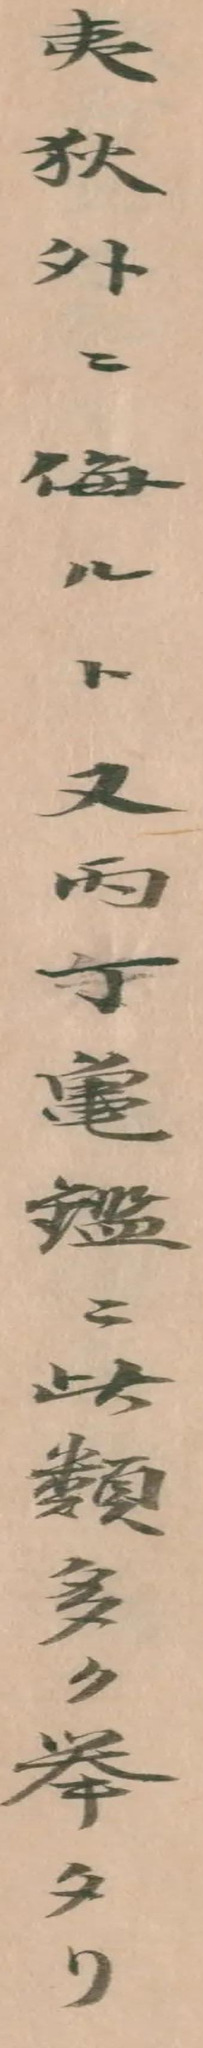夷狭外二侮ㇽト又丙丁亀鑑二此類多ク挙タリ
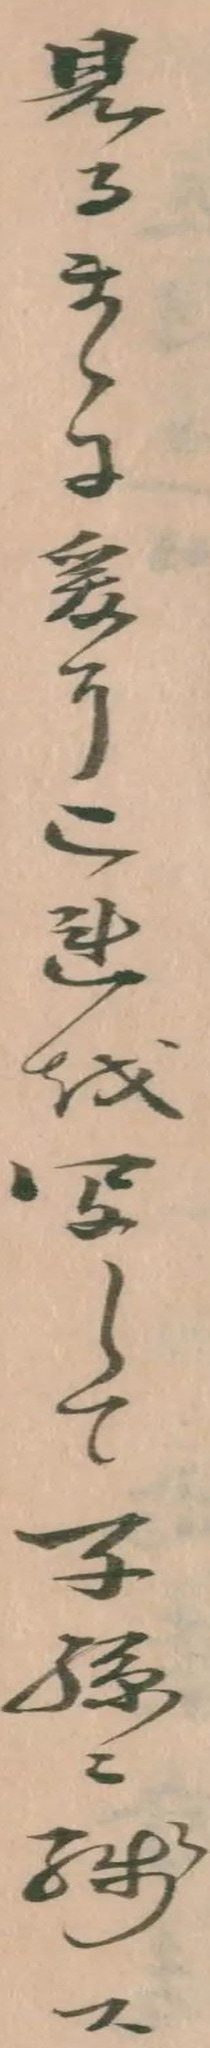見るまゝに爰にこれを写して子孫に残ス
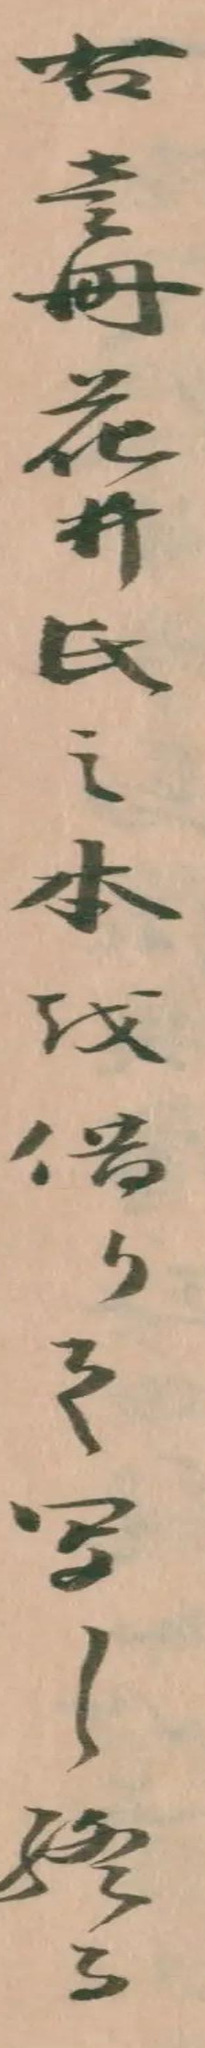右一冊花井氏之本を借りて写し終る
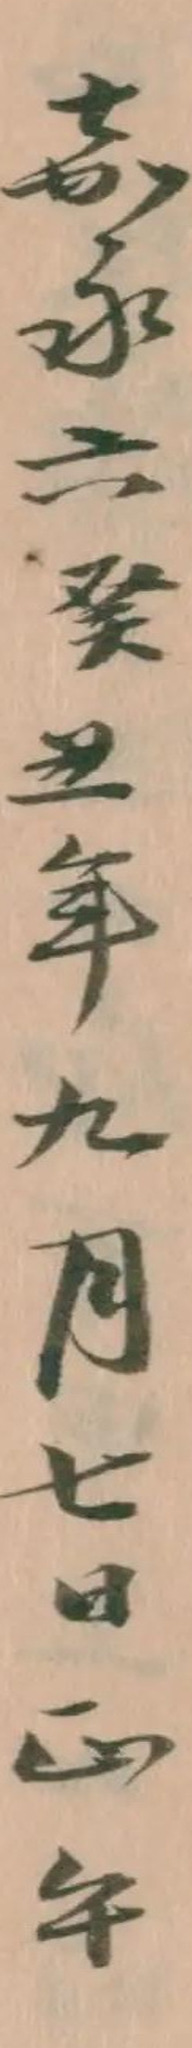嘉永六癸丑年九月七日正午三園
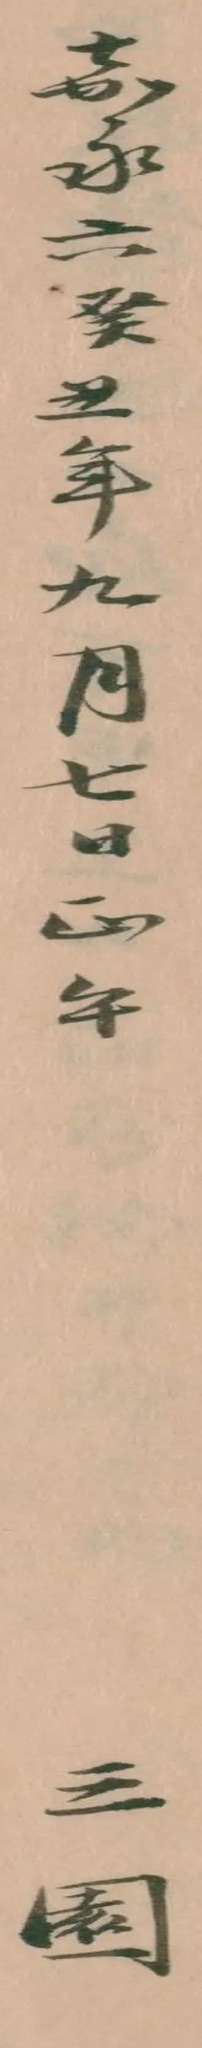嘉永六癸丑年九月七日正午三園
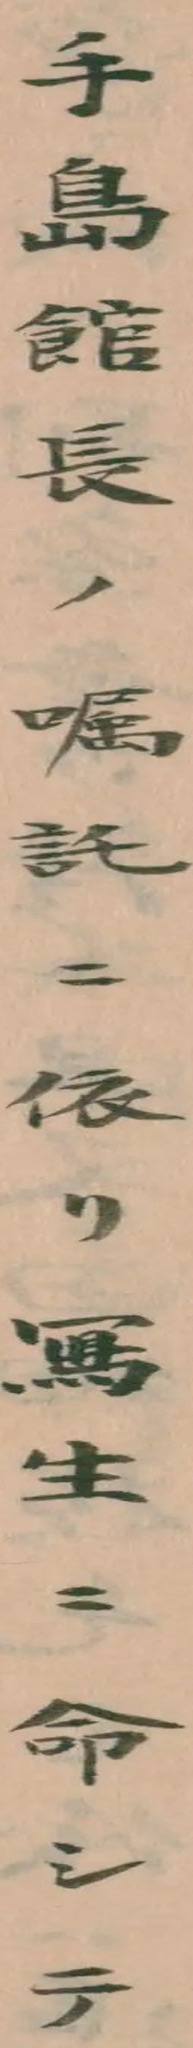手島館長ノ嘱託二依り写生二命シテ
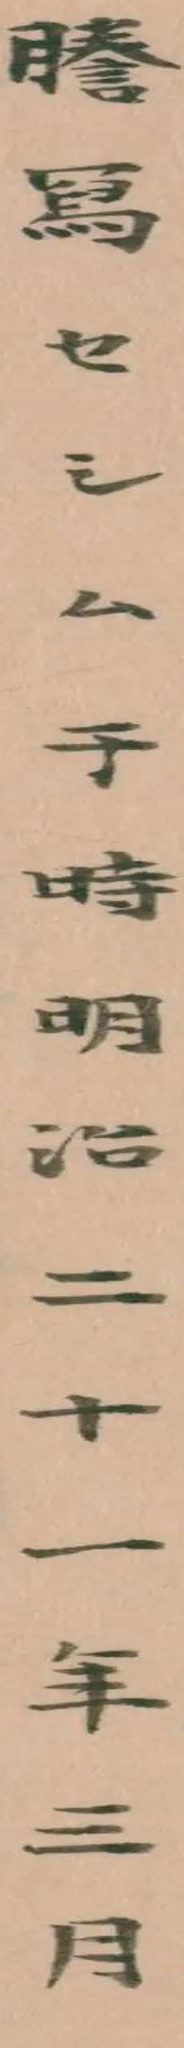謄写セシム干時明治二十一年三月
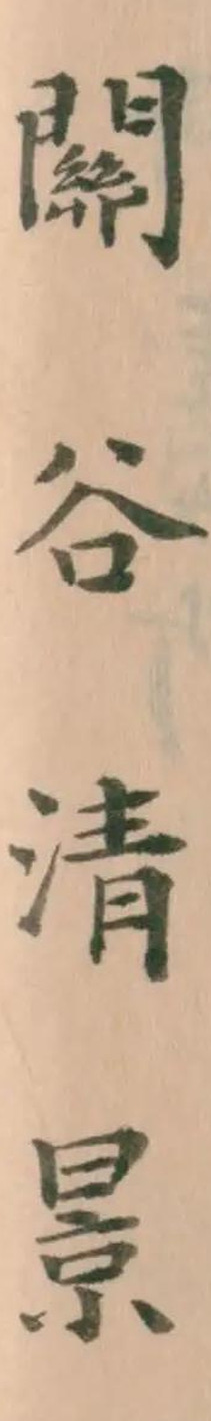関谷清景

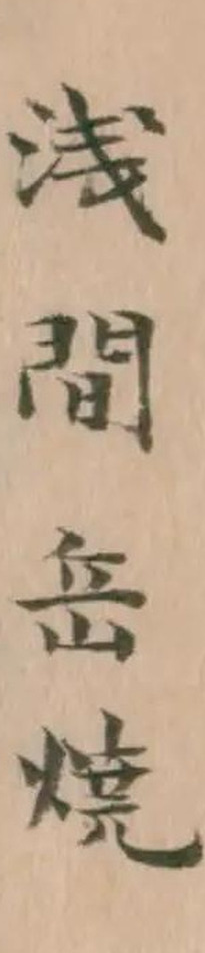浅間岳焼
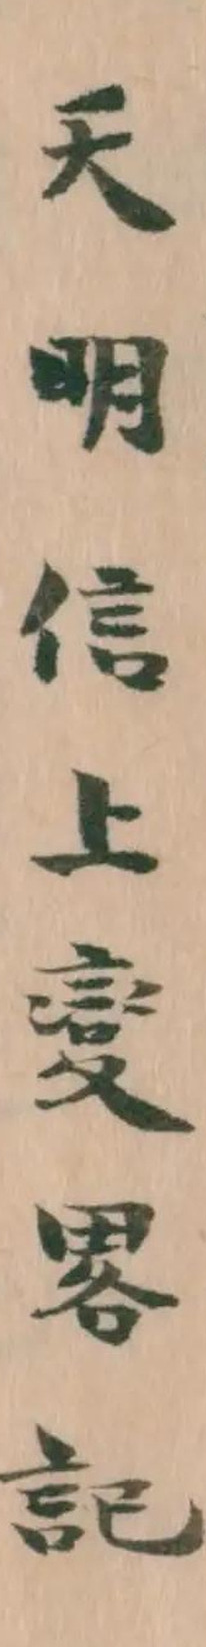天明信上変畧記

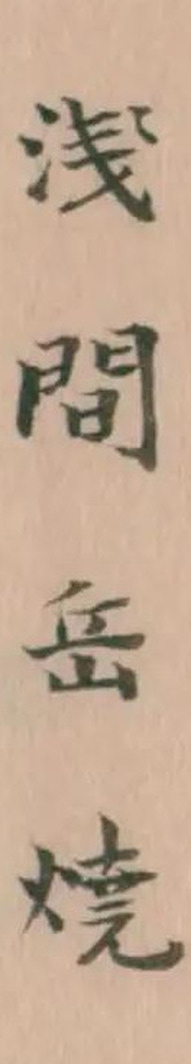浅間岳焼
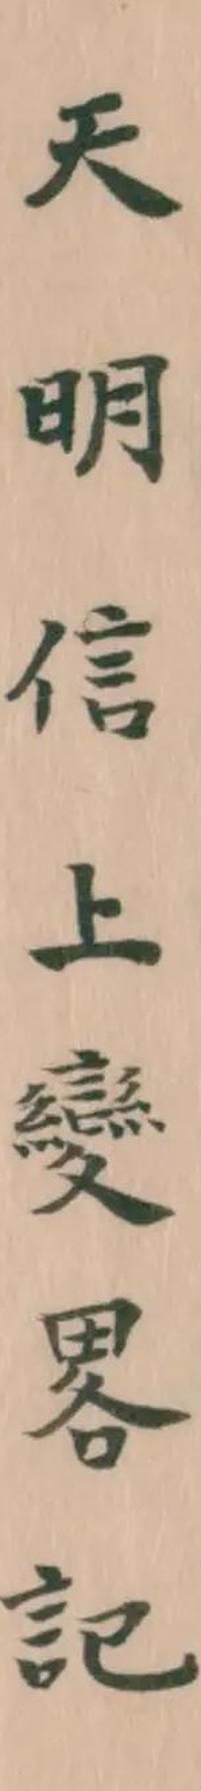天明信上変畧記

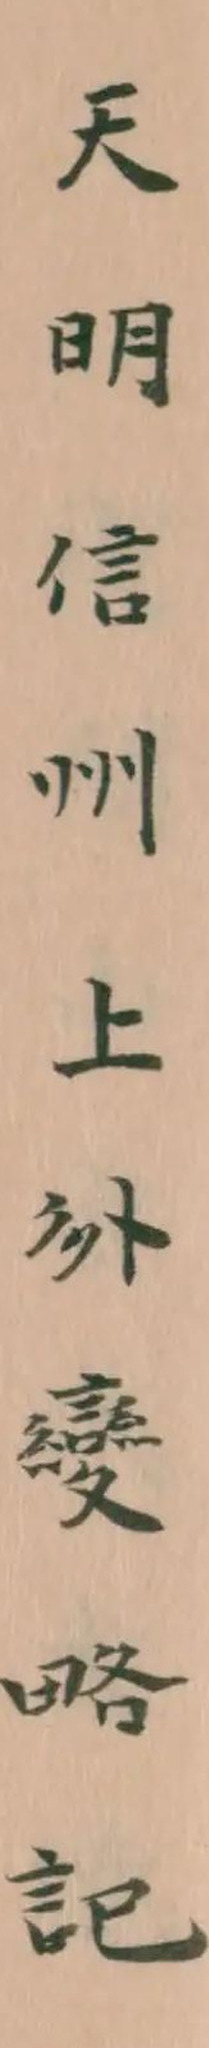天明信州上州変畧記
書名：地災撮要. 巻3(地震之部)-巻4(噴火之部)
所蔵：国立国会図書館 National Diet Library, JAPAN
